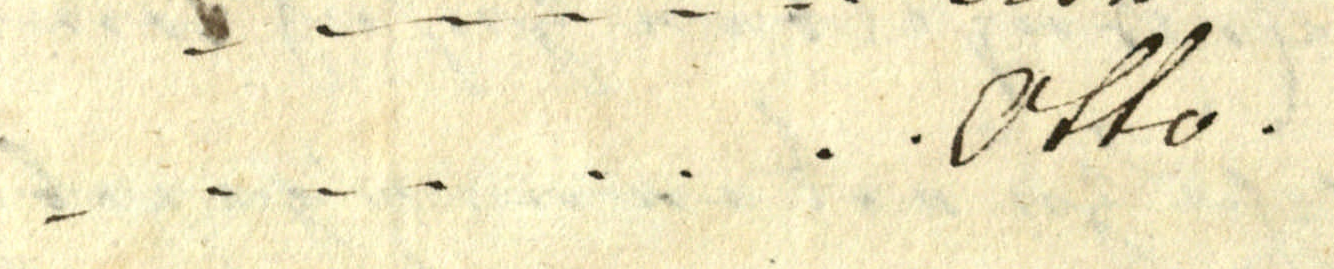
Otto.
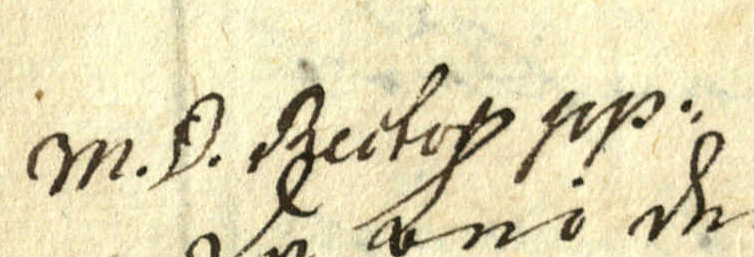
M. D. Rectore ppt¬
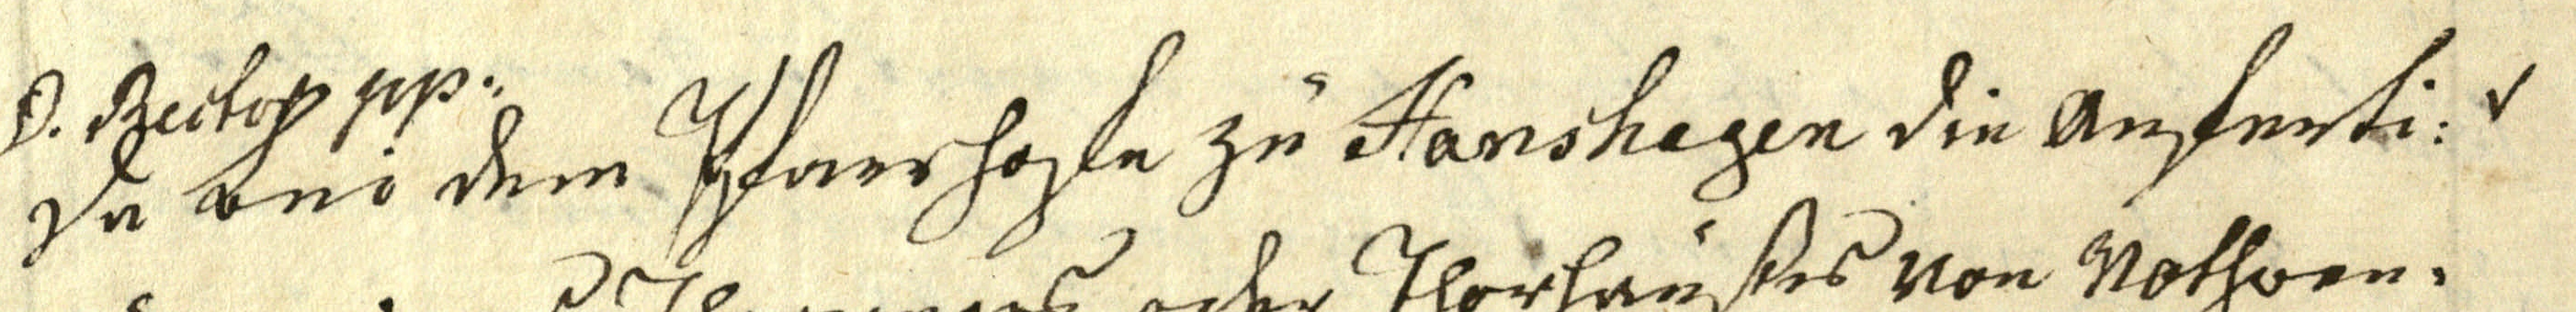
Da bei dem Pfarrhofe zu Hanshagen die Anferti¬
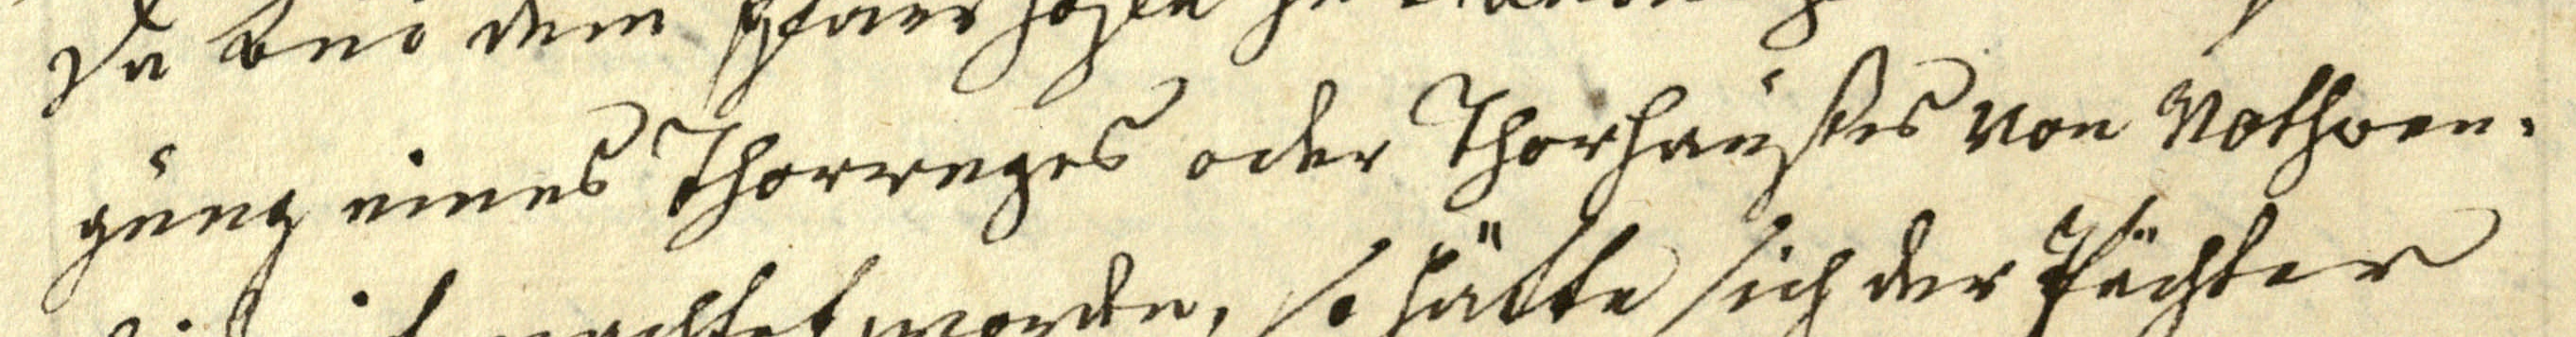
gung eines Thorweges oder Thorhaußes von Nothwen¬
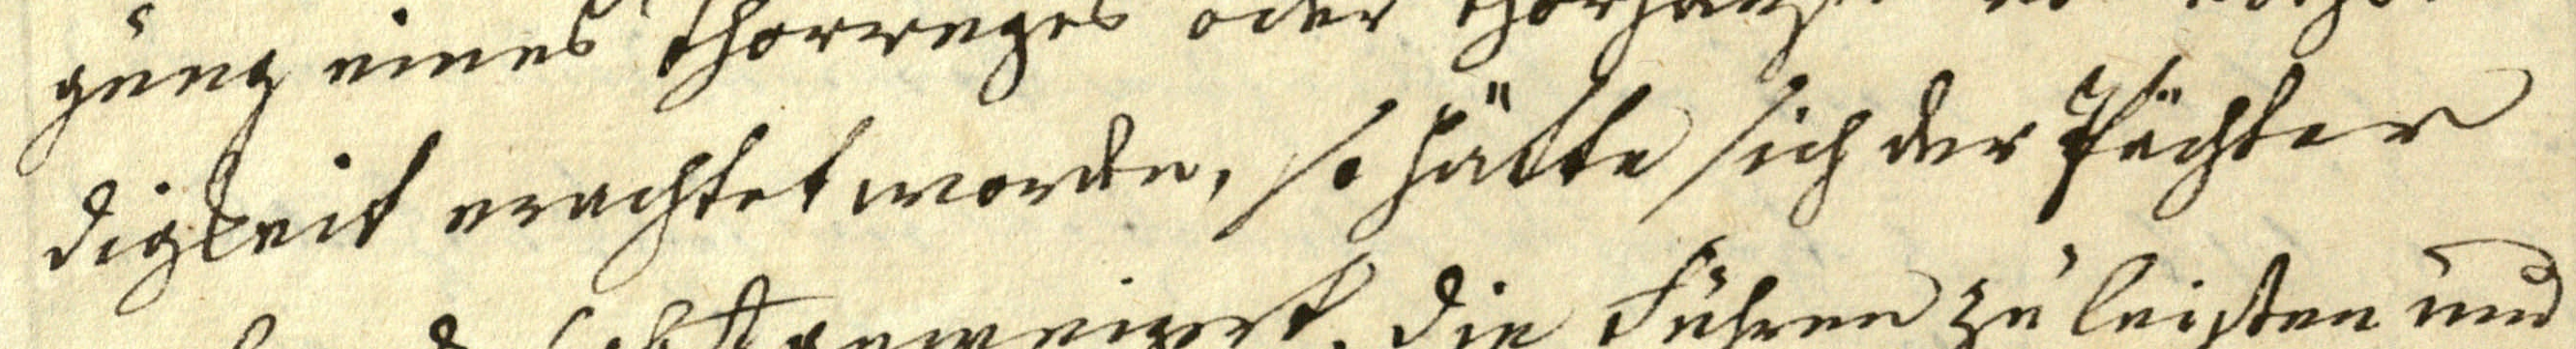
digkeit erachtet worden, so hätte sich der Pächter
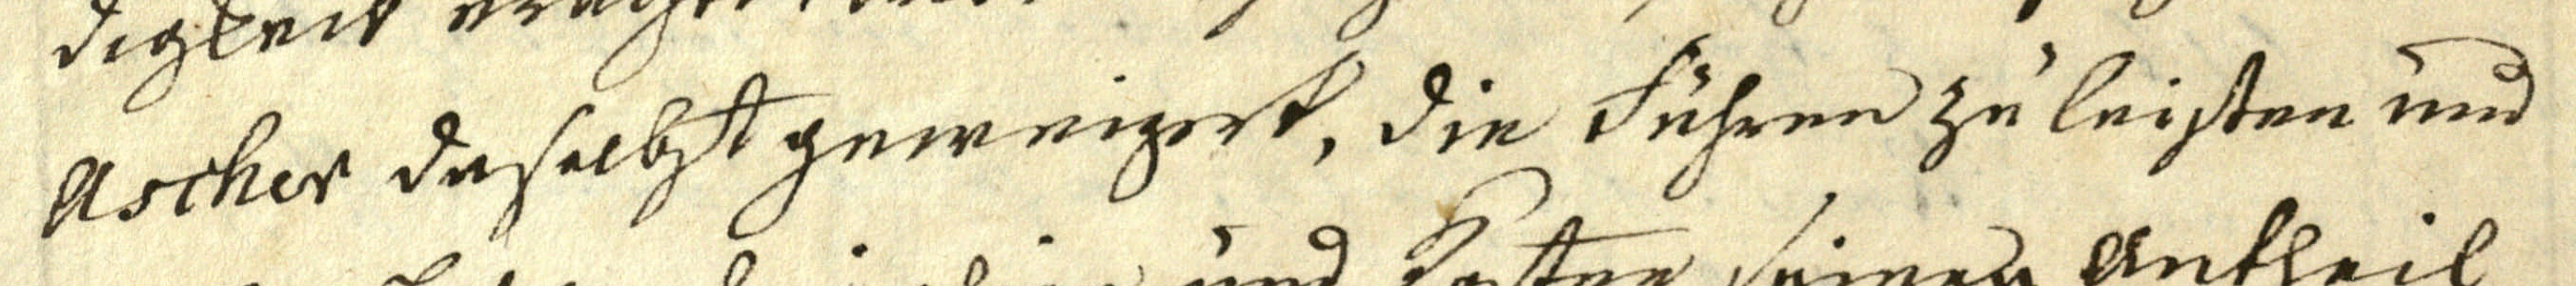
Ascher daselbst geweigert, die Fuhren zu leisten und
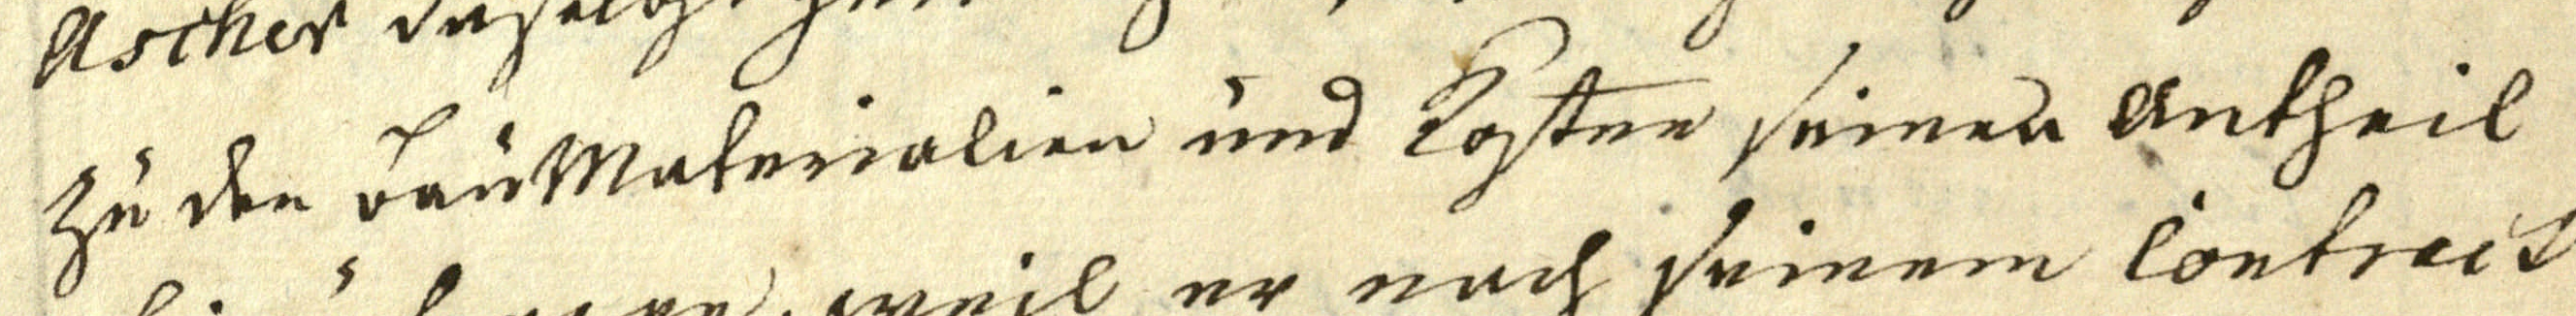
zu den BauMaterialien und Kosten seinen Antheil
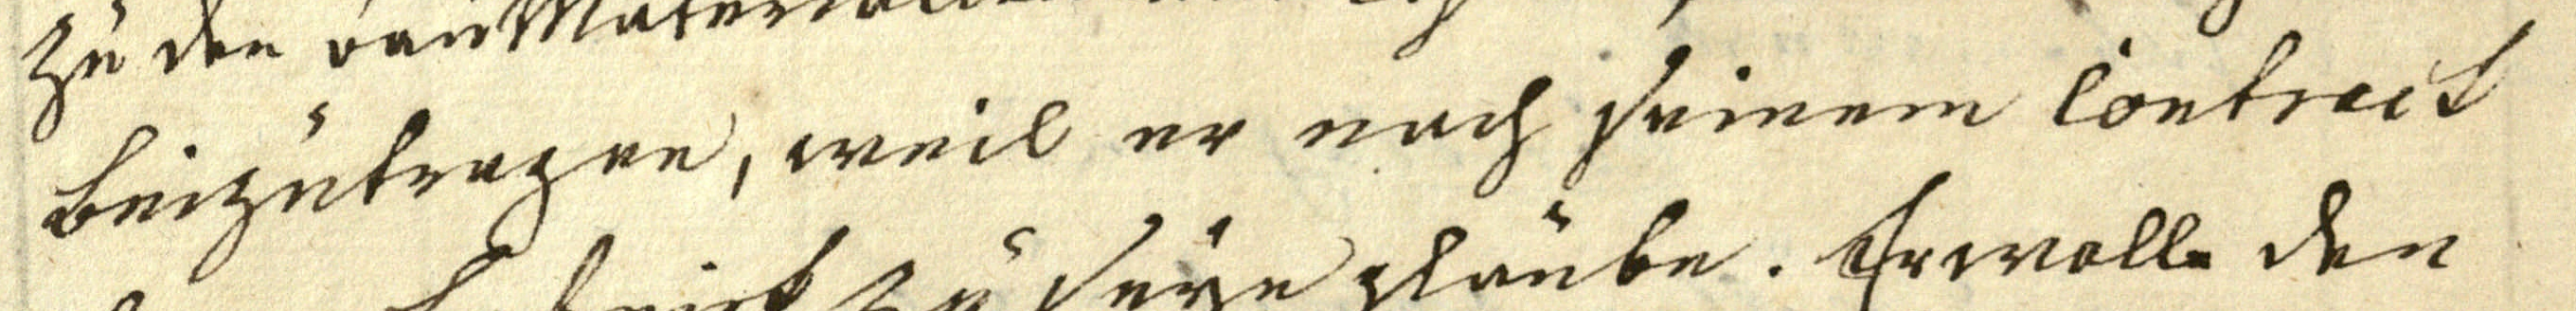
beizutragen, weil er nach seinem Contract
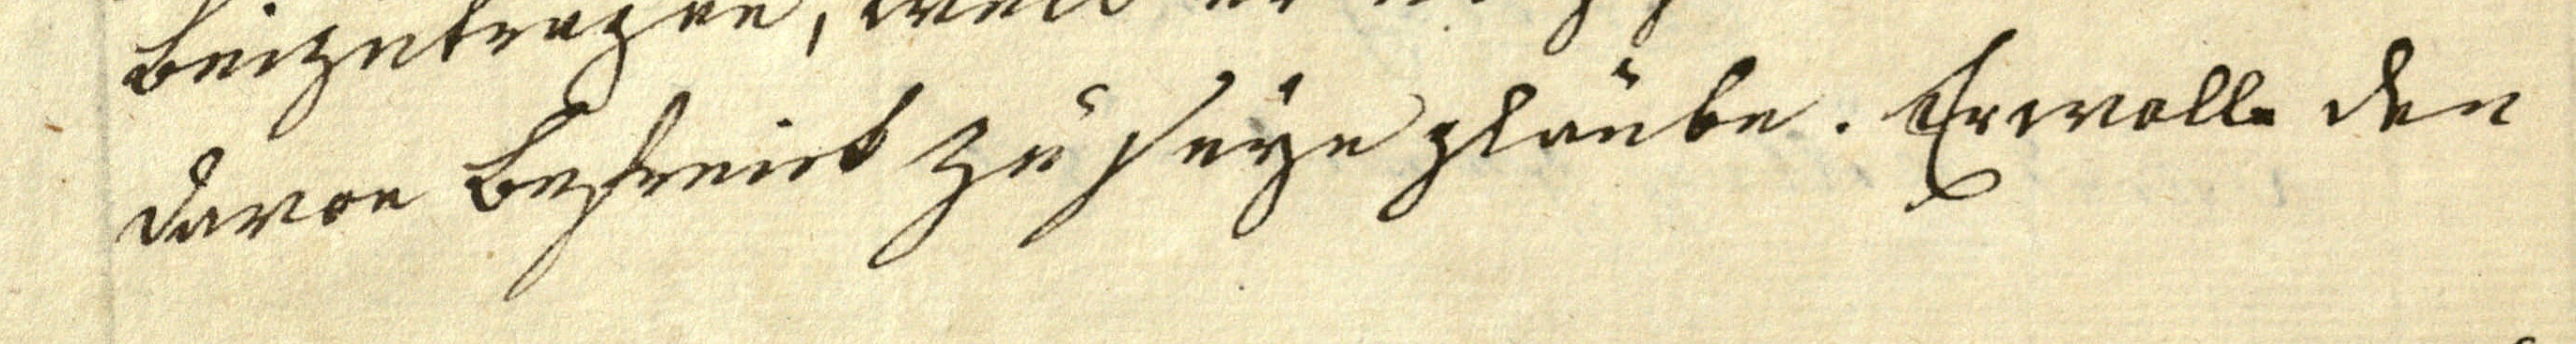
davon befreiet zu seÿn glaube. Er wolle den
